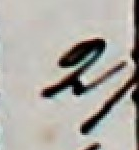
2
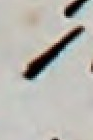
1
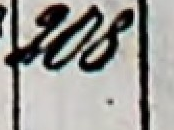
208
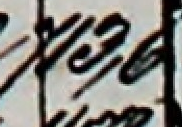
713,6
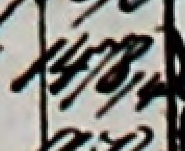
1478,4
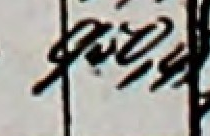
950,4
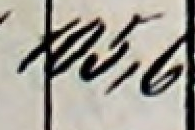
105,6
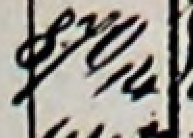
870,4
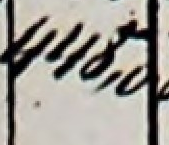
448,0
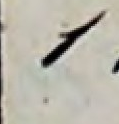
1
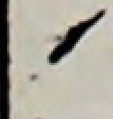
1
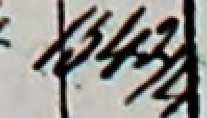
1542,4
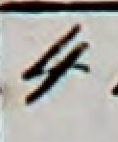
4
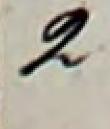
2
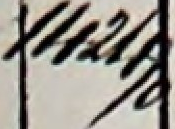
1424,0
